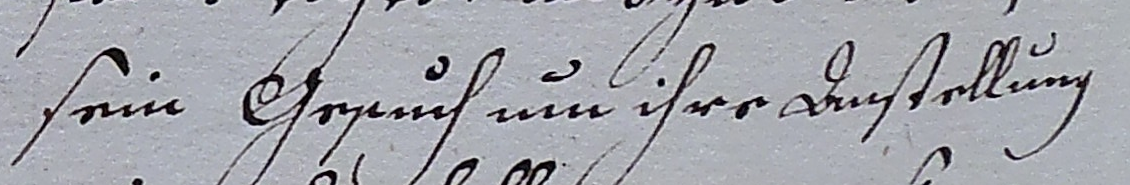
sein Gesuch um ihre Anstellung
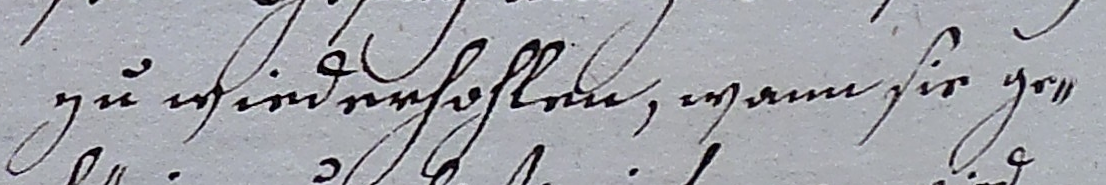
zu wiederhohlen, wann sie ge¬
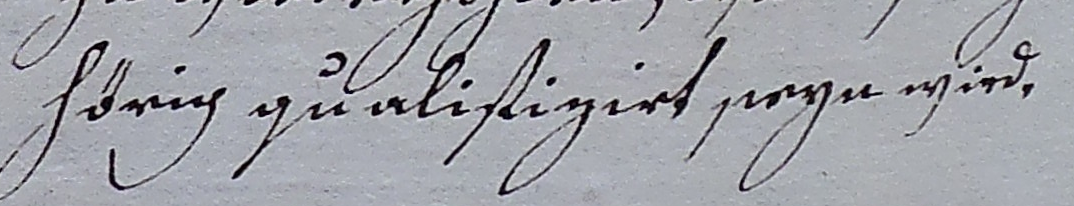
hörig qualifizirt, seyn wird.
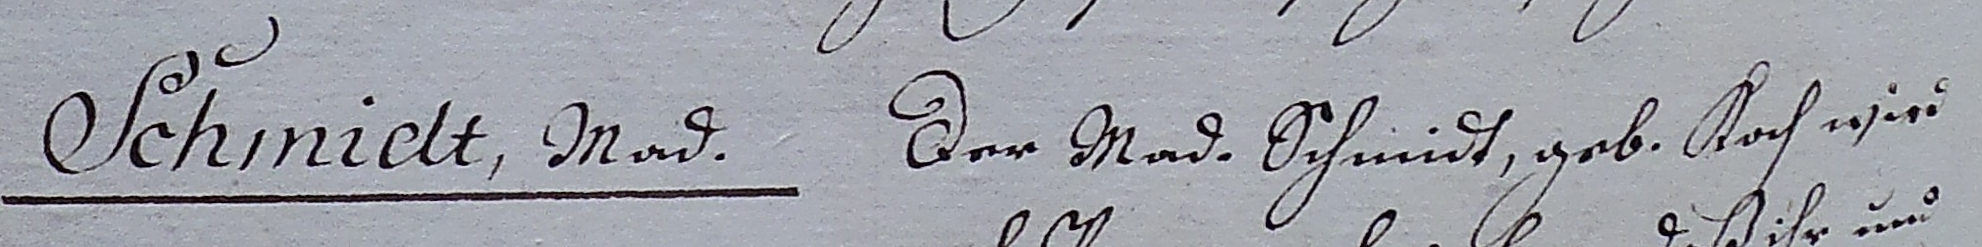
Schmidt, Mad. Der Mad. Schmidt, geb. Koch wird
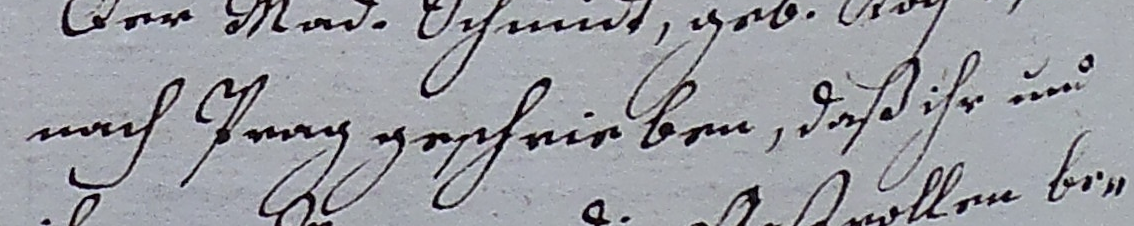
nach Prag geschrieben, daß ihr und
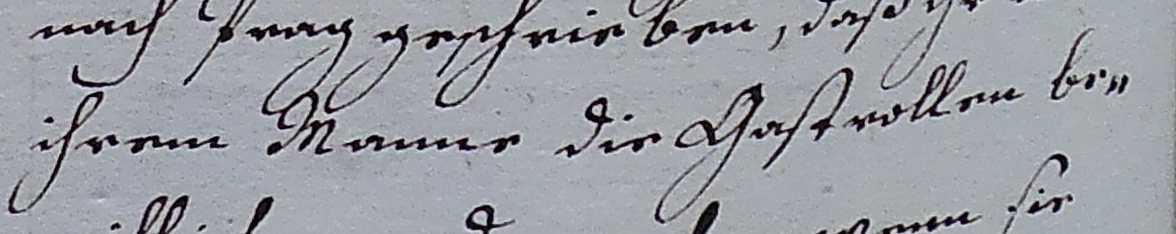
ihrem Manne die Gastrollen be¬
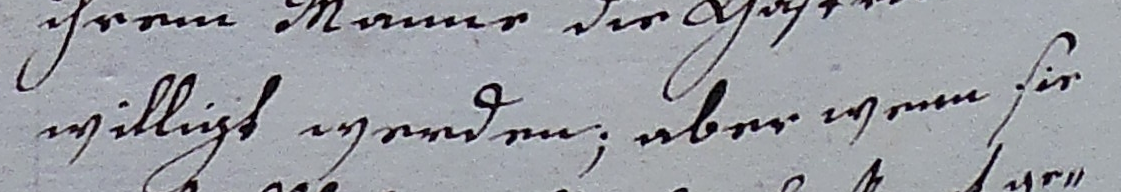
willigt werden, aber wenn sie
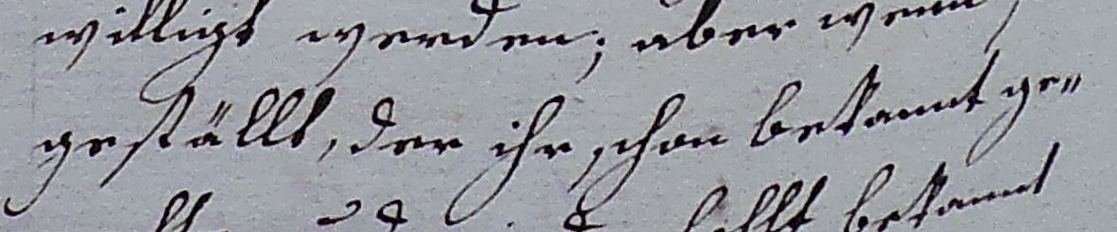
gefällt, der ihr schon bekannt ge¬
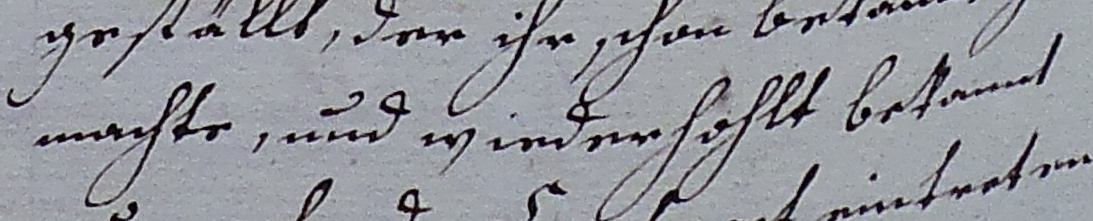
machte, und wiederhohlt bekannt
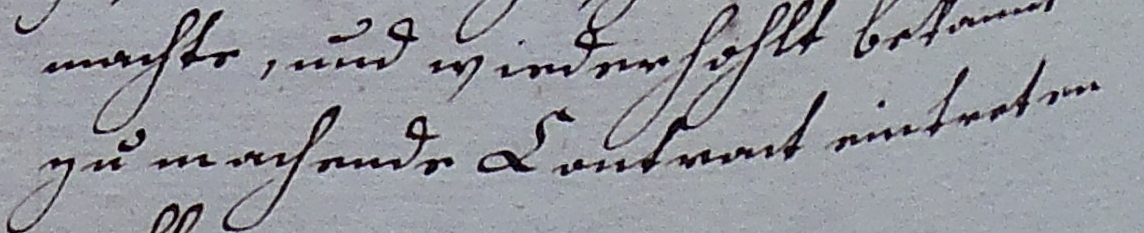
zu machende Contract eintreten
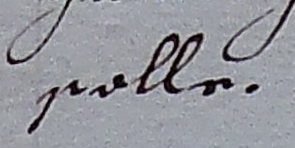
solle.
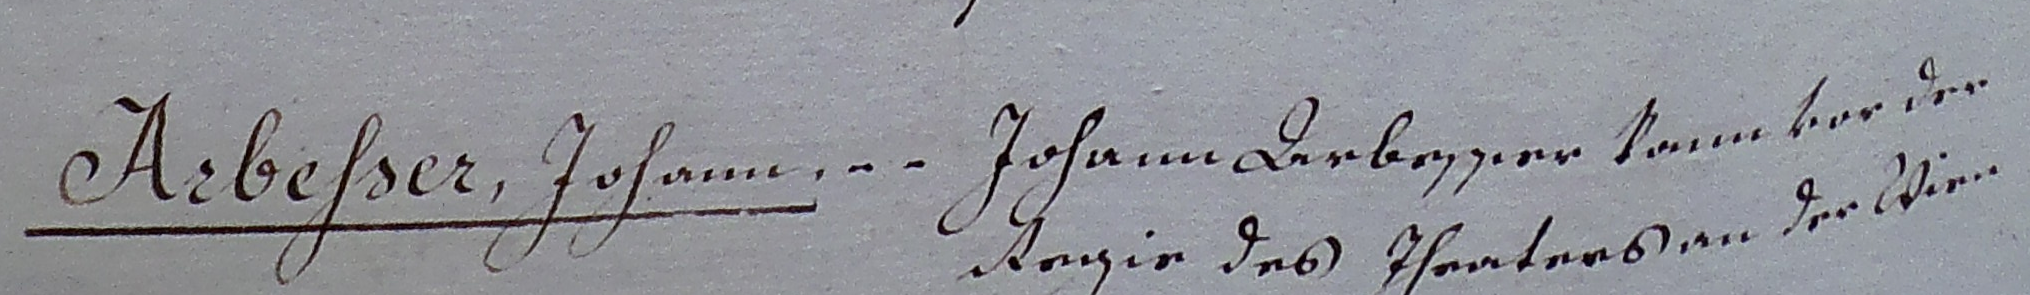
Arbesser, Johann. .. .. Johann Arbesser kann vor der
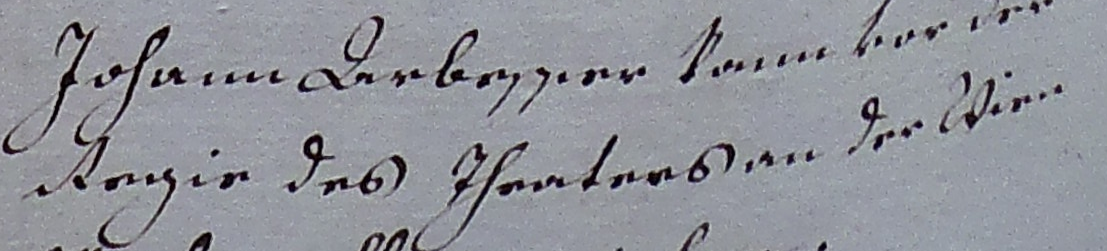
Regie des Theaters an der Wien
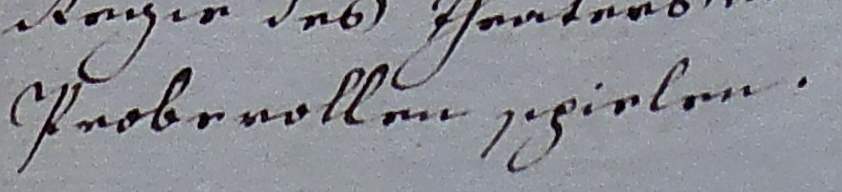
Proberollen spielen.
